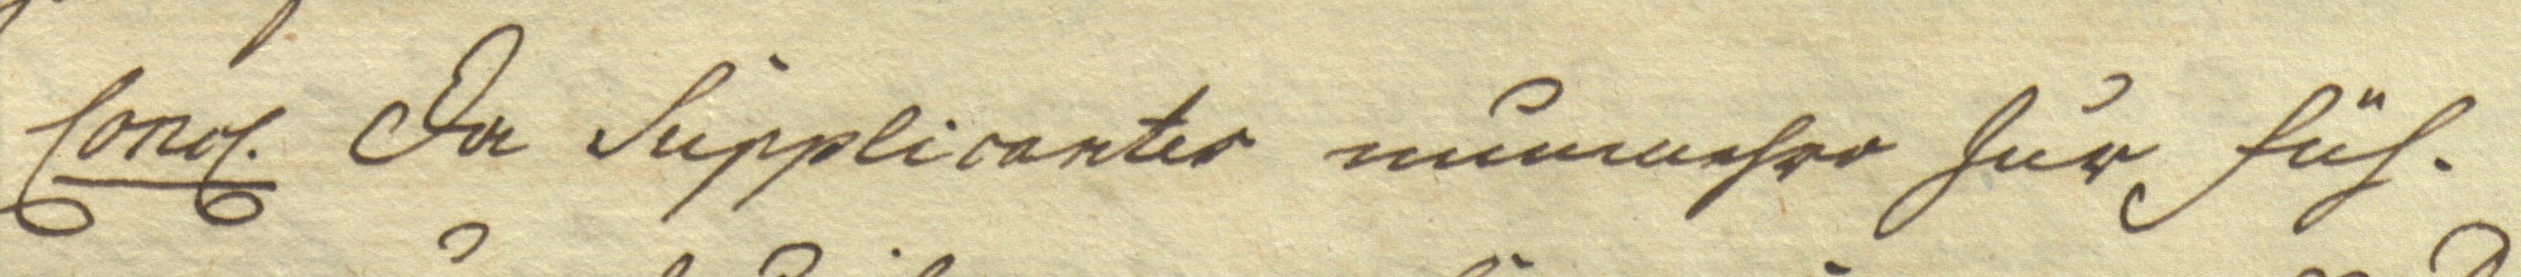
Concl. Da Supplicantes nunmehro zur Füh¬
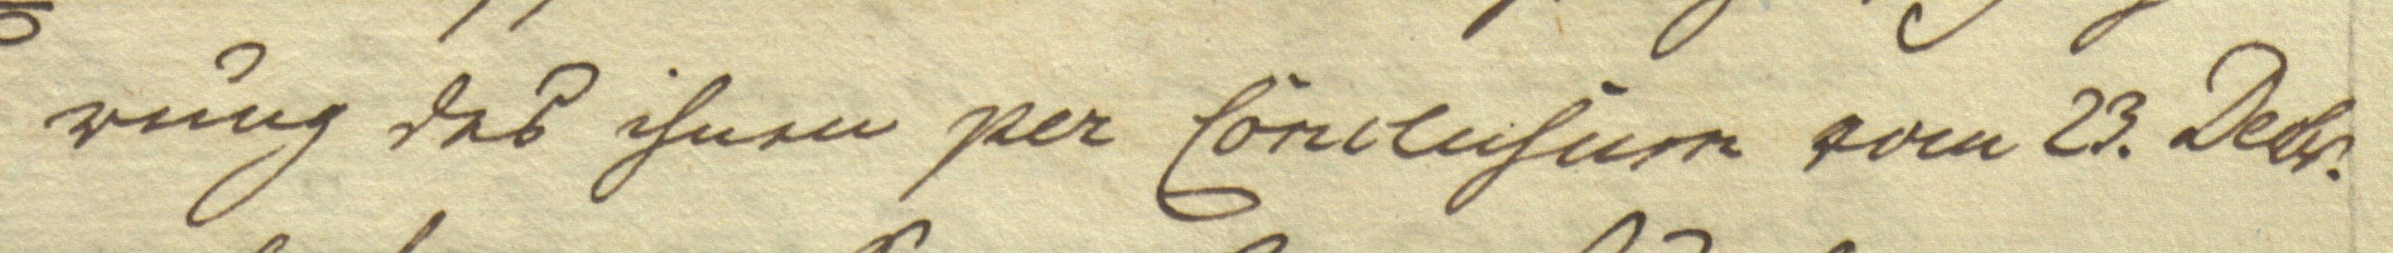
rung des ihnen per Conclusum vom 23. Debr.
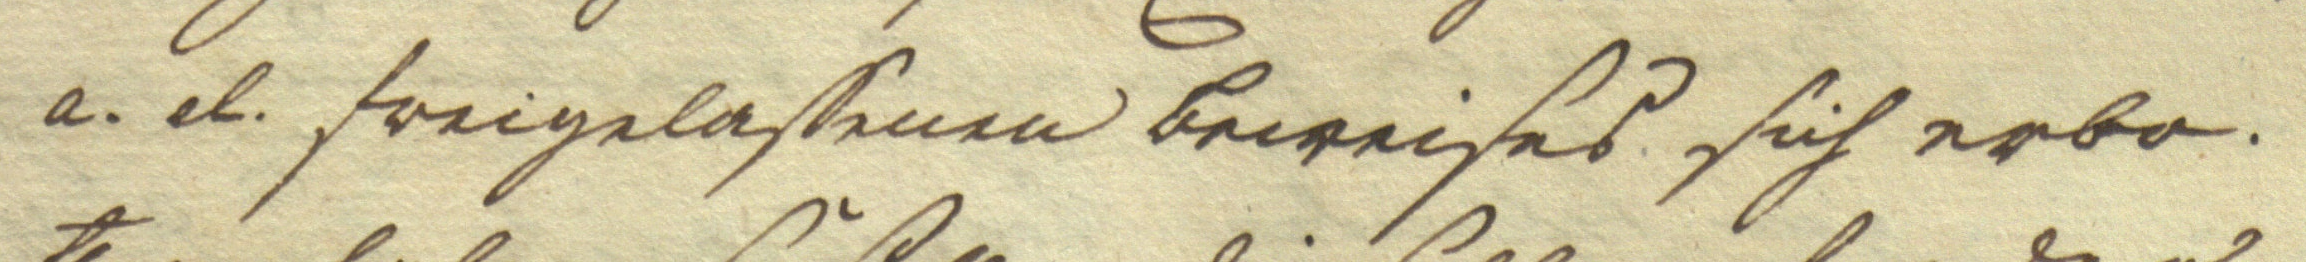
a. el. freigelassenen Beweises sich erbo¬
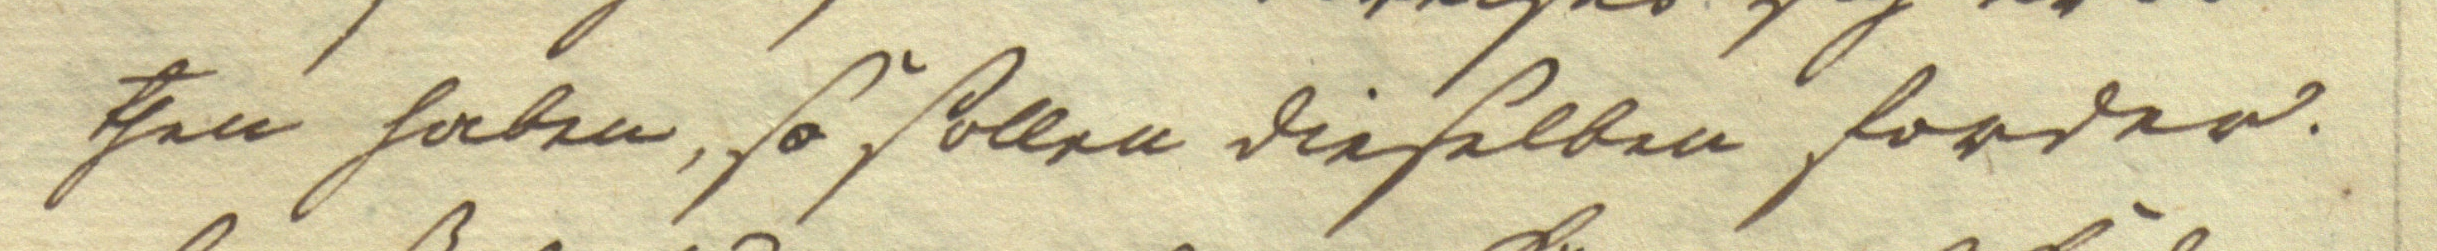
then haben, so sollen dieselben forder¬
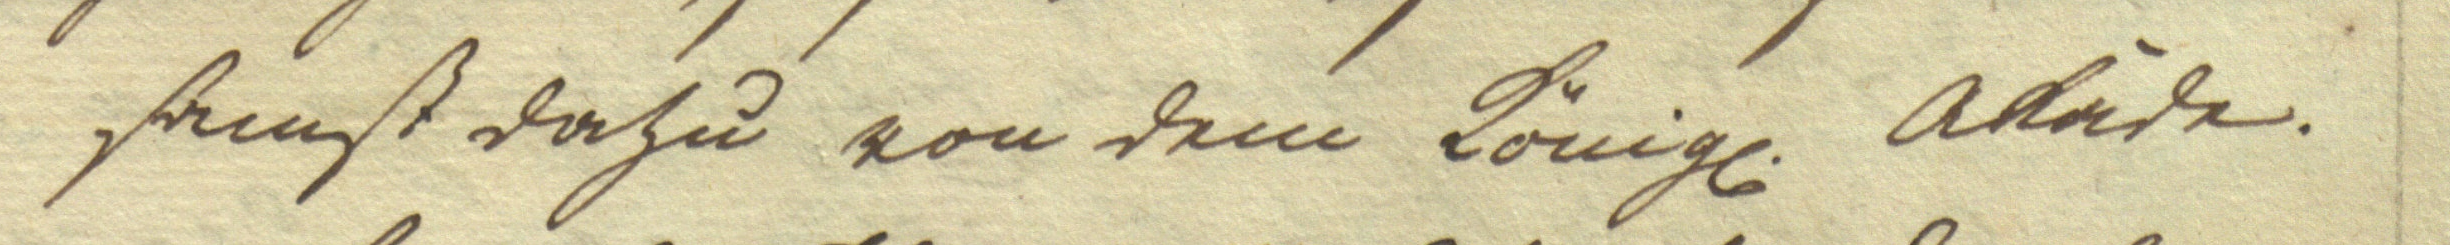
samst dazu von dem Königl. Akade¬
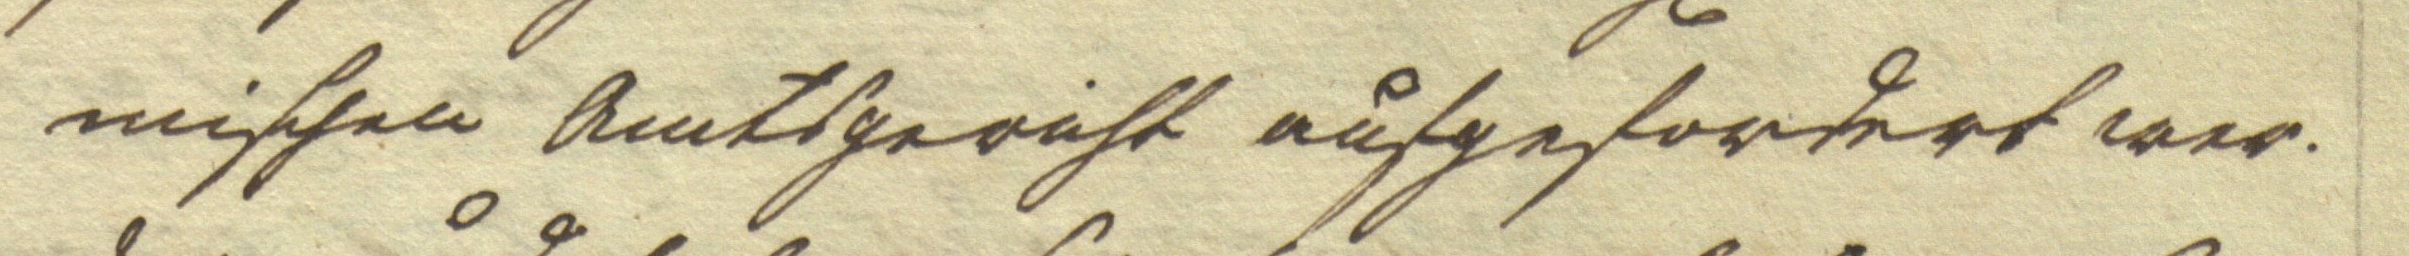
mischen Amtsgericht aufgefordert wer¬
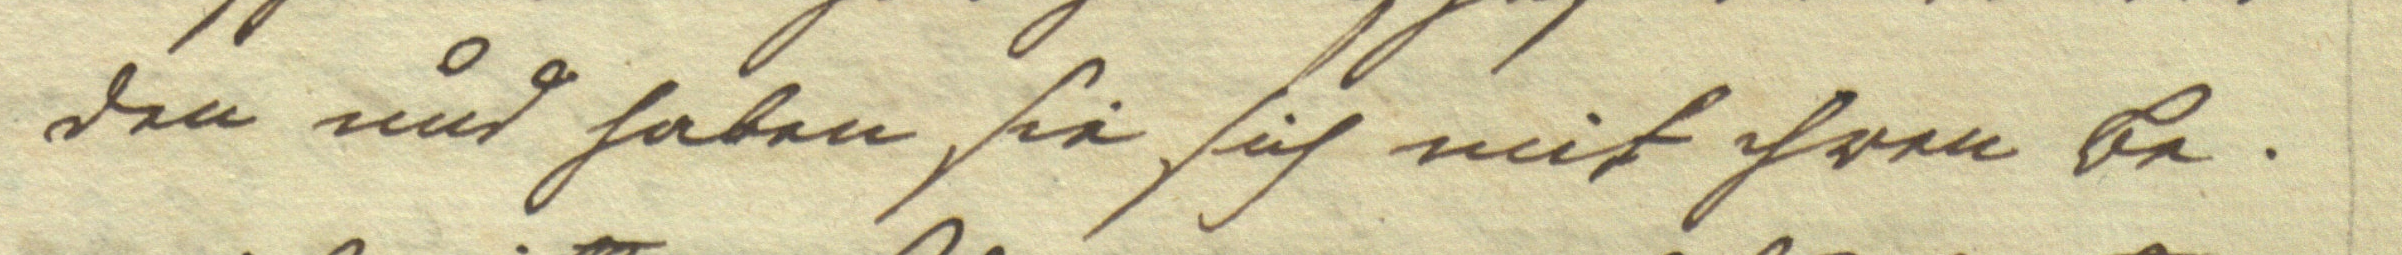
den und haben sie sich mit ihren Be¬
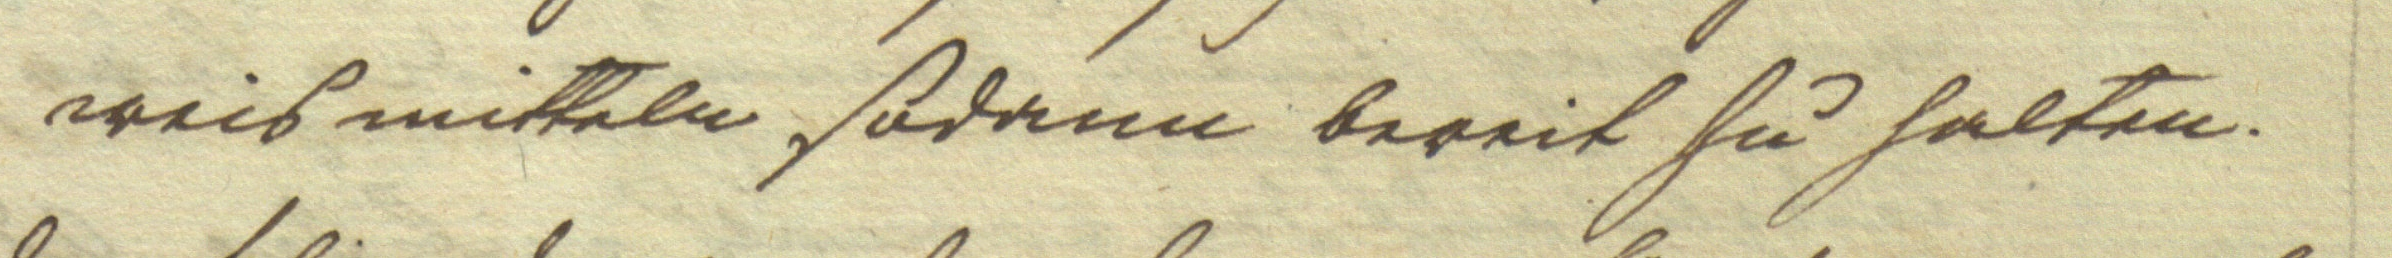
weismitteln sodann bereit zu halten.
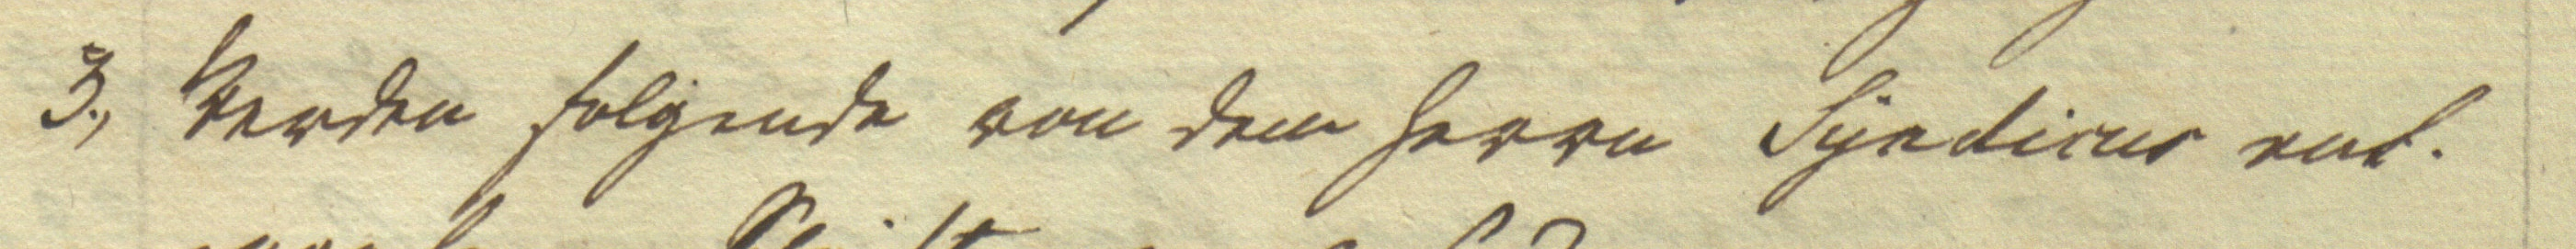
3., Werden folgende von dem Herrn Sÿndicus ent¬
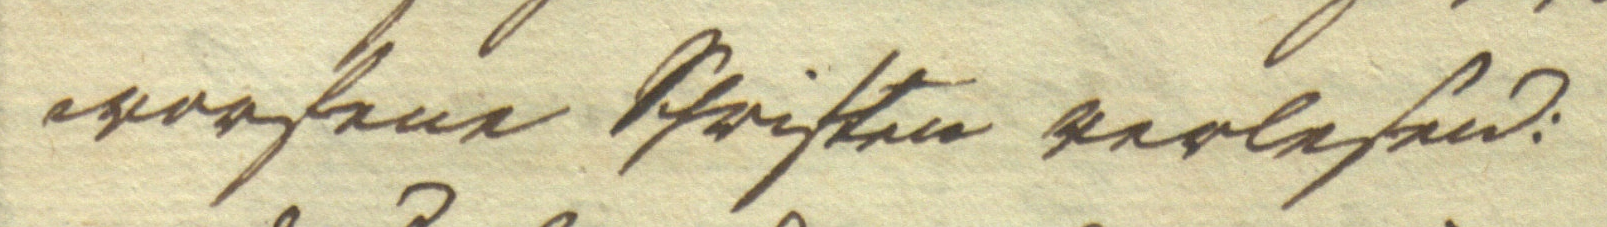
worfene Schriften verlesen:
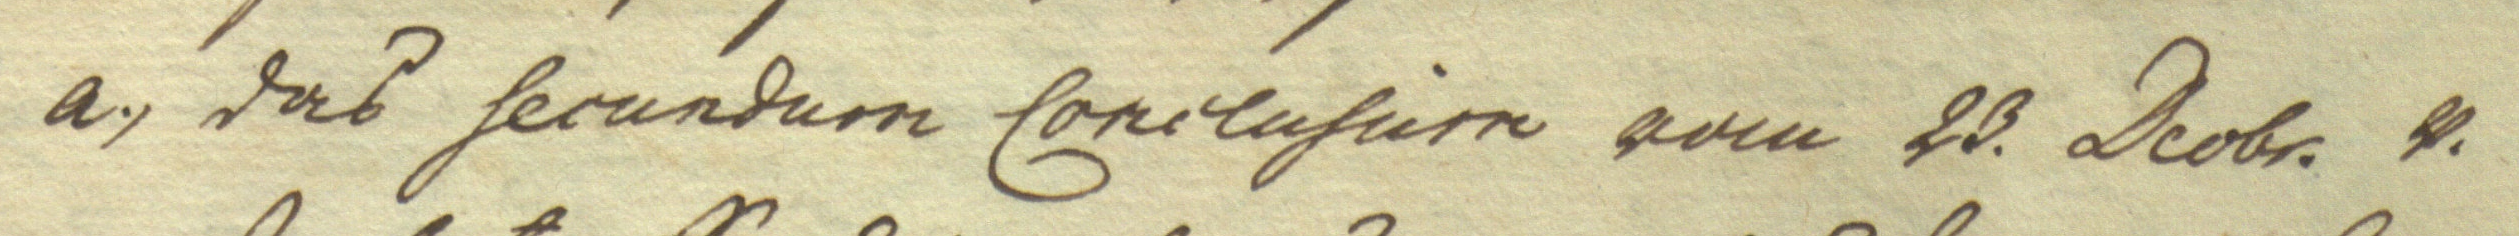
a., das secundum Conclusum vom 23. Decbr. v.
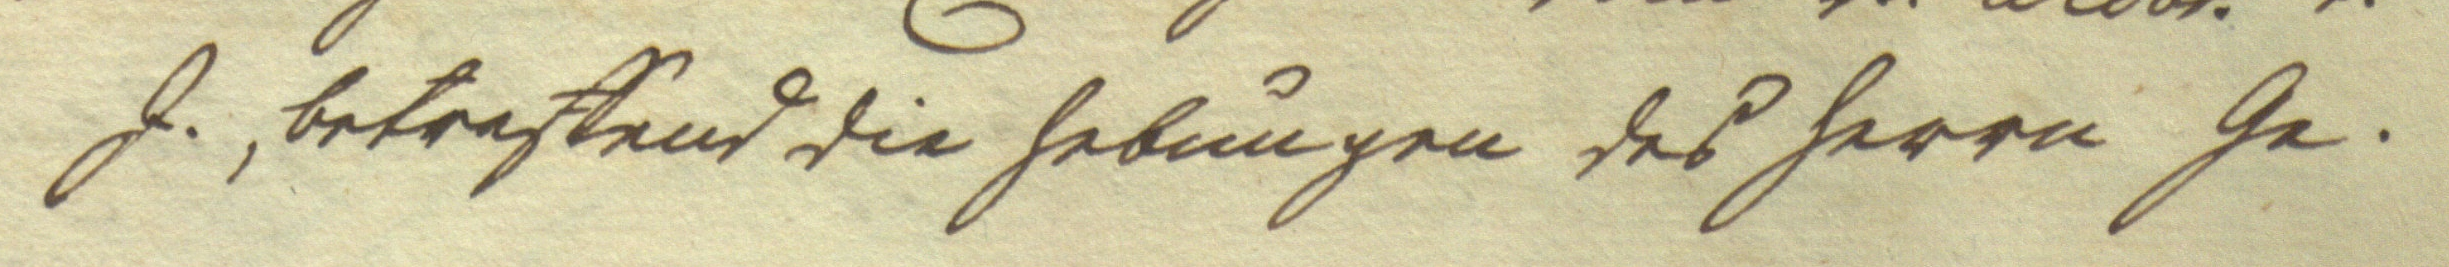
J. betreffend die Hebungen des Herrn Ge¬
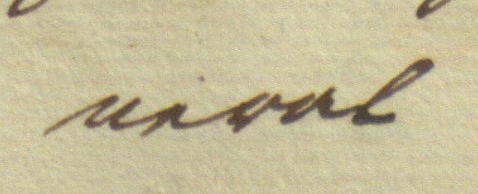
neral
